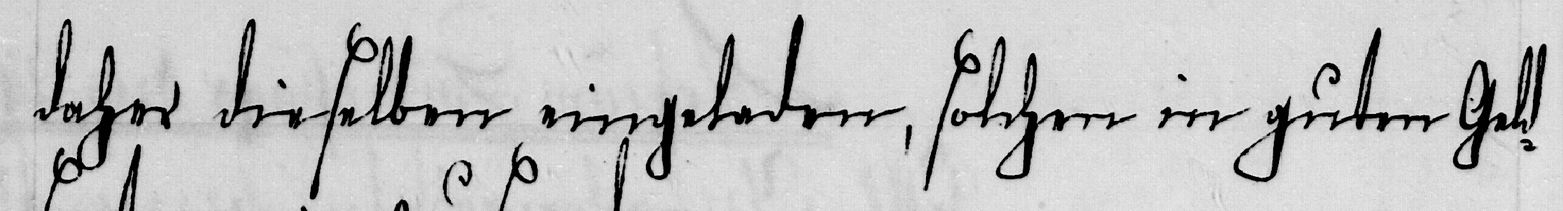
daher dieselben eingeladen, solchen in guten Gel¬
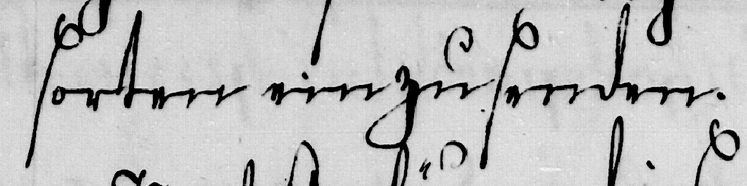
dsorten einzusenden.
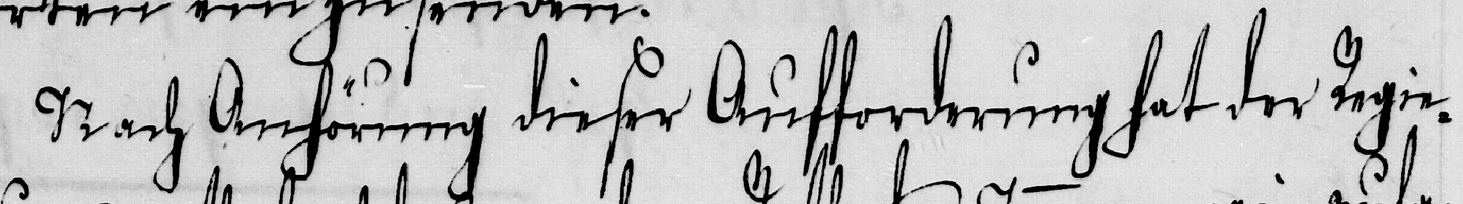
Nach Anhörung dieser Aufforderung hat der Regi¬
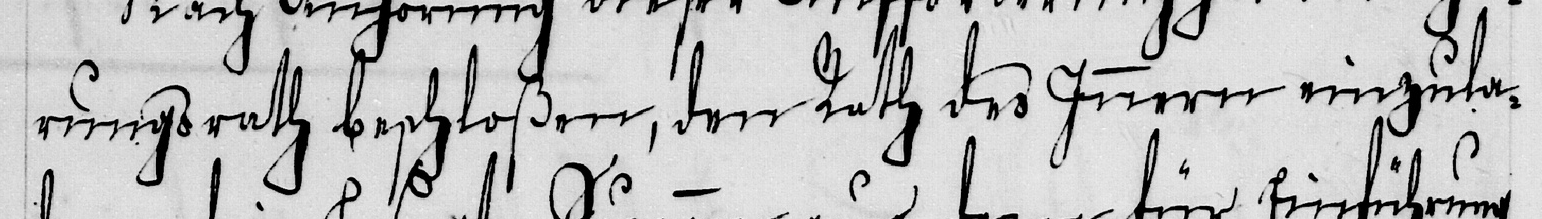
erungsrath beschloßen, den Rath des Innern einzula¬
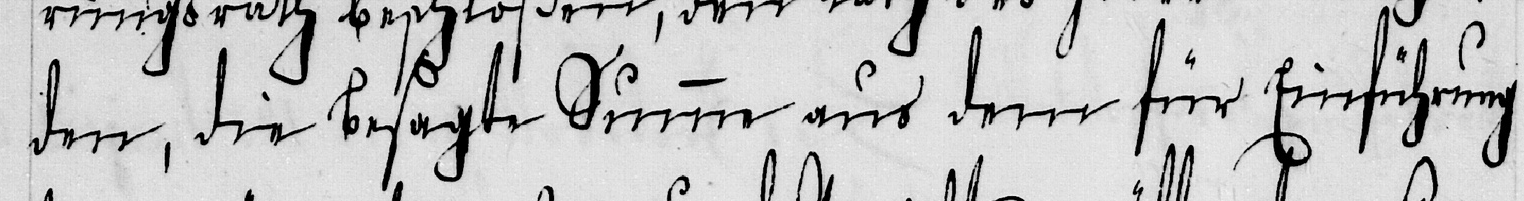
den, die besagte Summe aus dem für Einführung
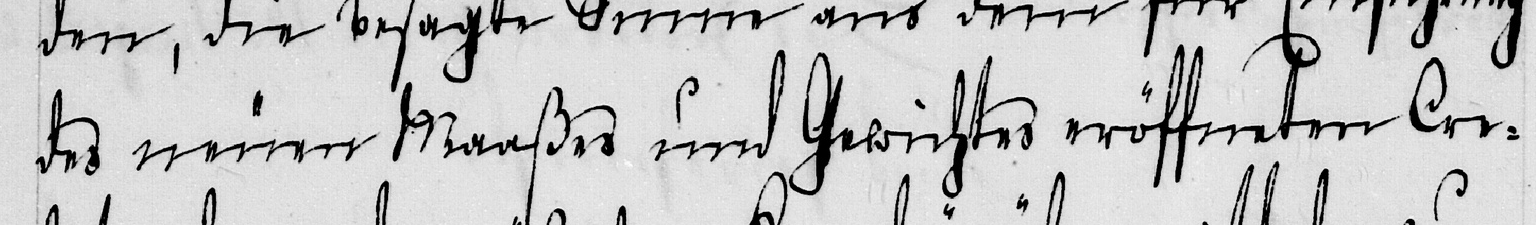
des neuen Maaßes und Gewichtes eröffneten Cre¬
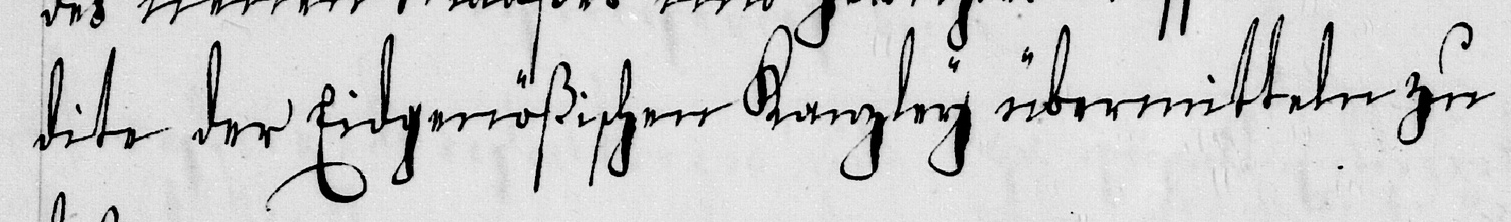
dite der Eidgenößischen Kanzley übermitteln zu
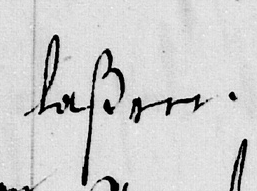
laßen.
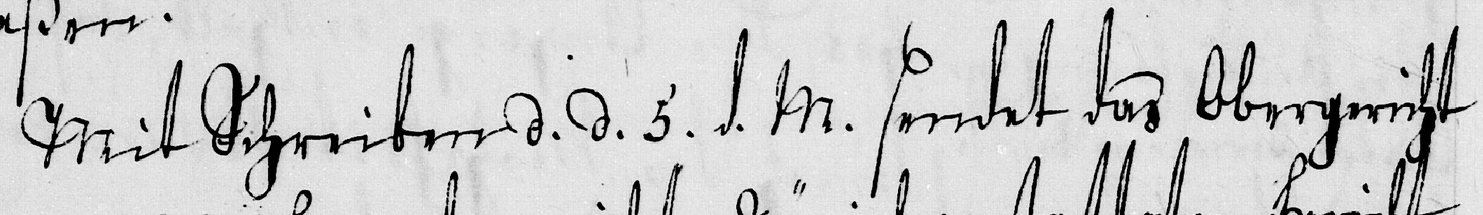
Mit Schreiben d. d. 5. d. M. sendet das Obergericht
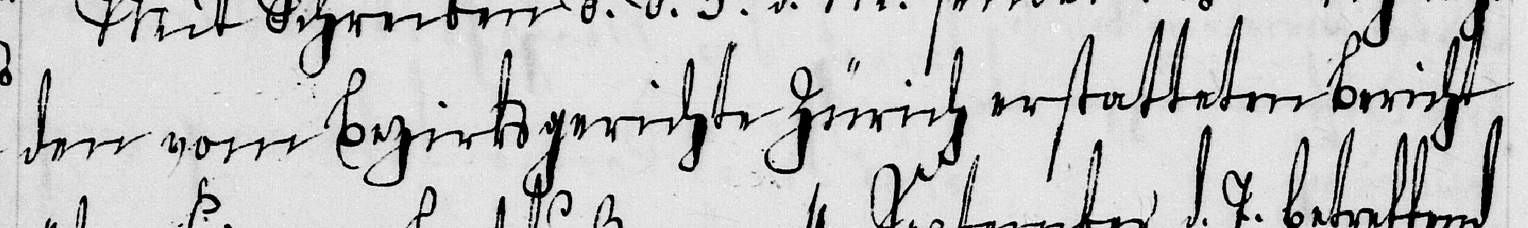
den vom Bezirksgerichte Zürich erstatteten Bericht
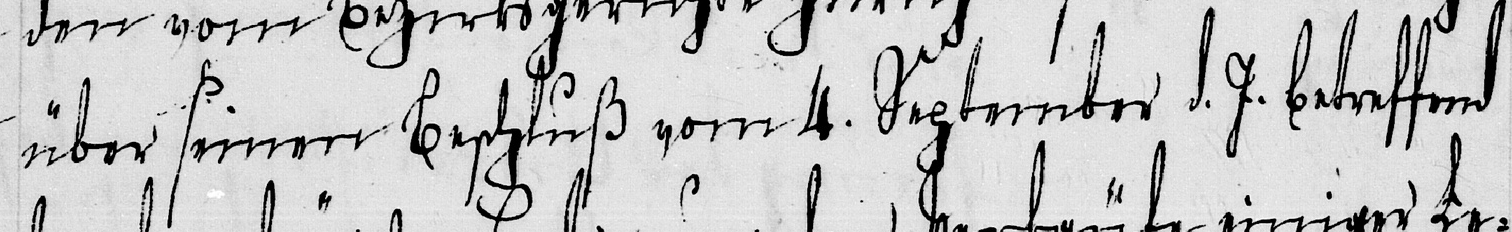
über seinen Beschluß vom 4. September d. J. betreffe¬
